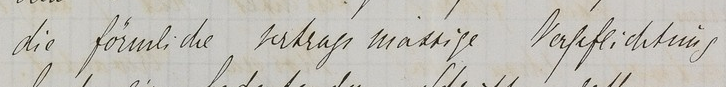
die förmliche vertragsmässige Verpflichtung
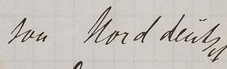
von Norddeutsch-
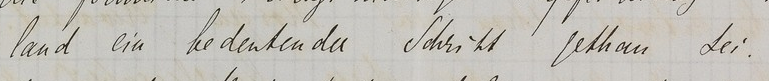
land ein bedeutender Schritt gethan sei.
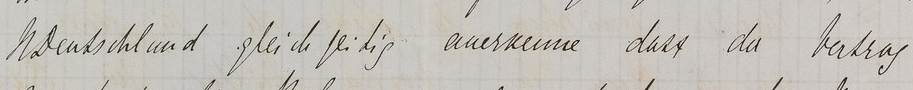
NDeutschland gleichzeitig anerkenne dass der Vertrag
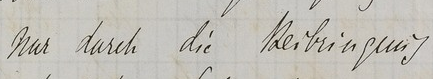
nur durch die Beibringung
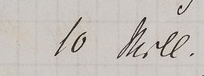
10 Mill.
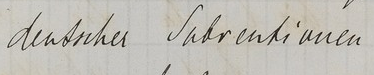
deutscher Subventionen
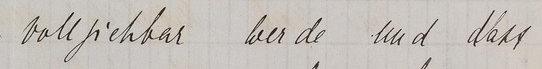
vollziehbar werde und dass
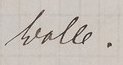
wolle.
